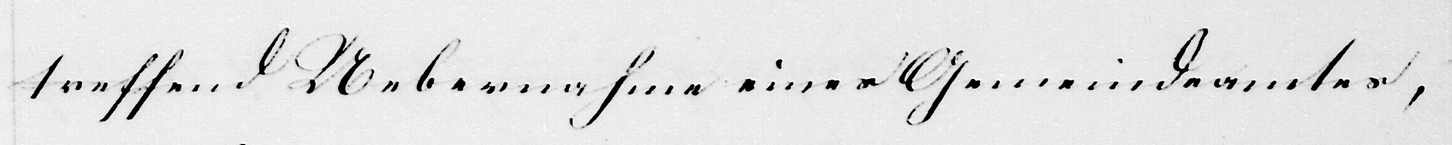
treffend Uebernahme eines Gemeindeamtes,
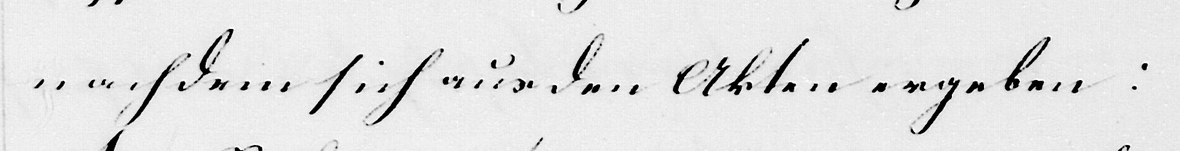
nachdem sich aus den Akten ergeben:
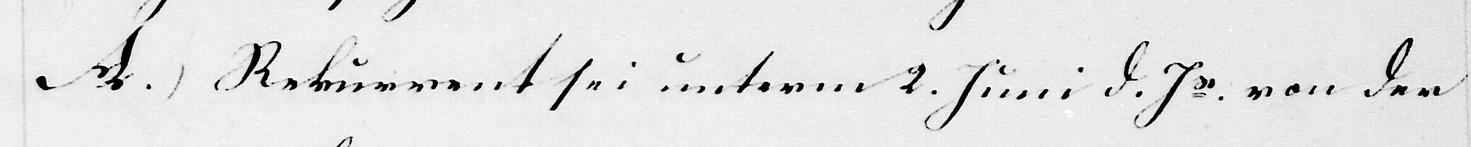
A.) Rekurrent sei unterm 2. Juni d. Js. von der
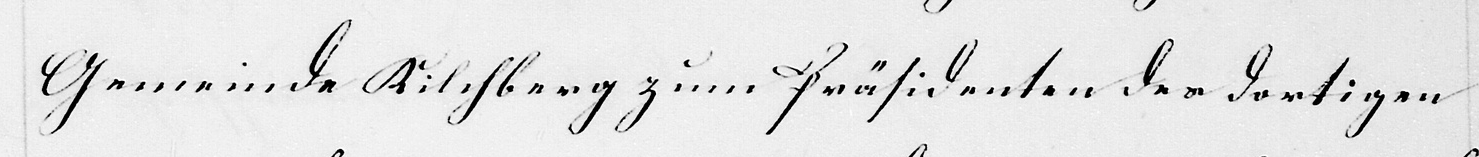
Gemeinde Kilchberg zum Präsidenten des dortigen
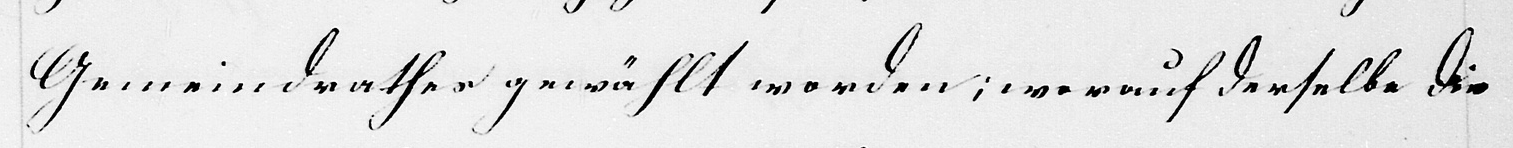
Gemeindrathes gewählt worden; worauf derselbe die
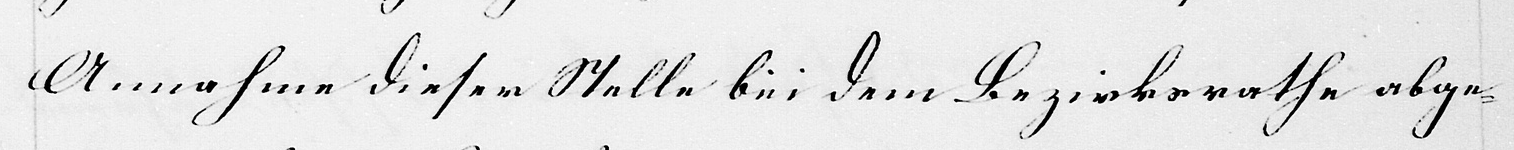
Annahme dieser Stelle bei dem Bezirksrathe abge¬
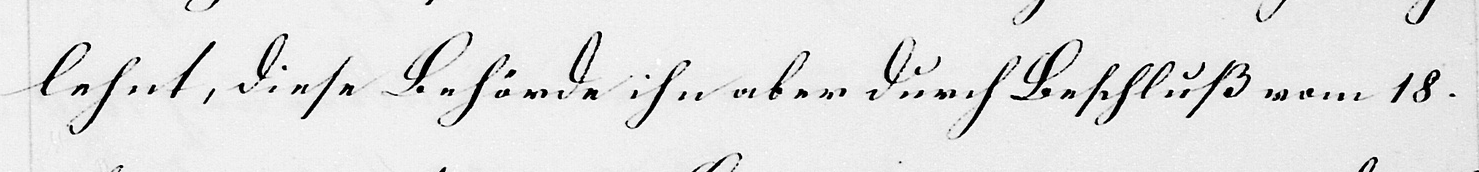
lehnt, diese Behörde ihn aber durch Beschluß vom 18.
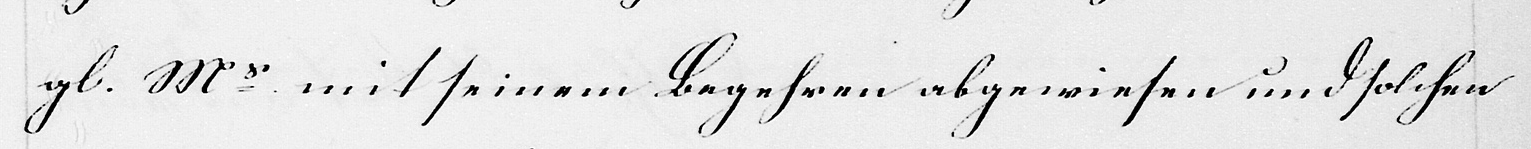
gl. Ms mit seinem Begehren abgewiesen und solchen
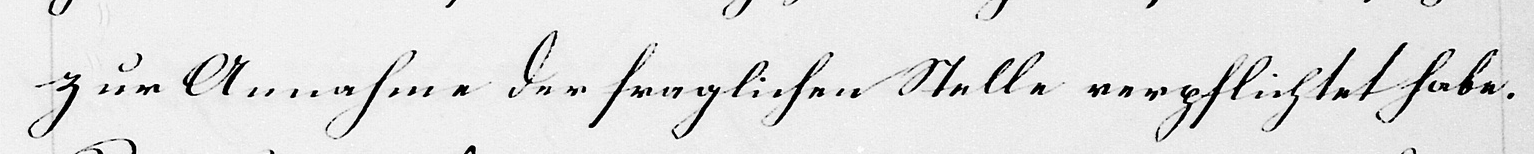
zur Annahme der fraglichen Stelle verpflichtet habe.
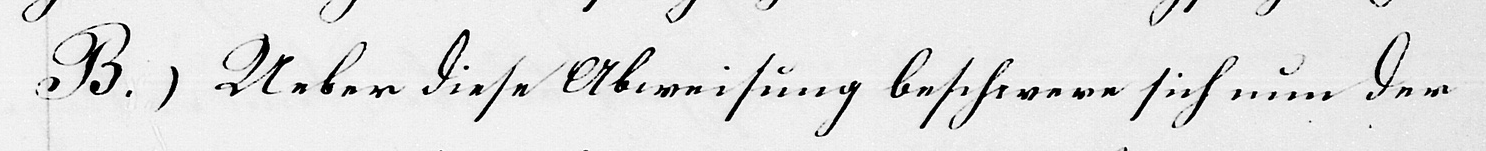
B.) Ueber diese Abweisung beschwere sich nun der
